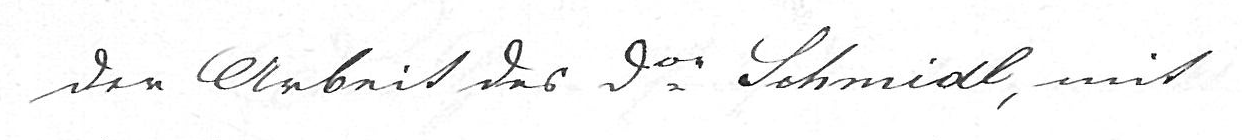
der Arbeit der Dor Schmidl, mit
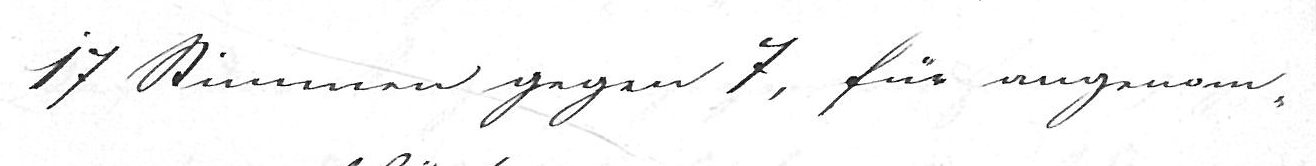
17 Stimmen gegen 7, für angenom-
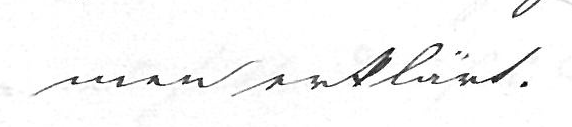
men erklärt.
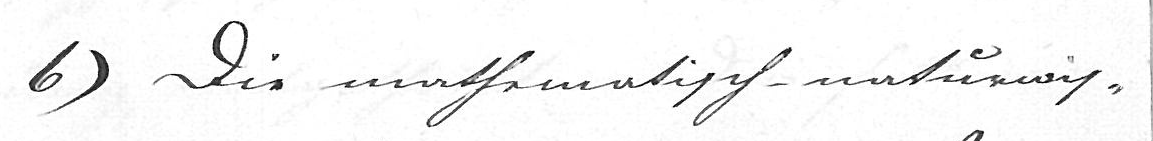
b) Die mathematisch-naturwis-
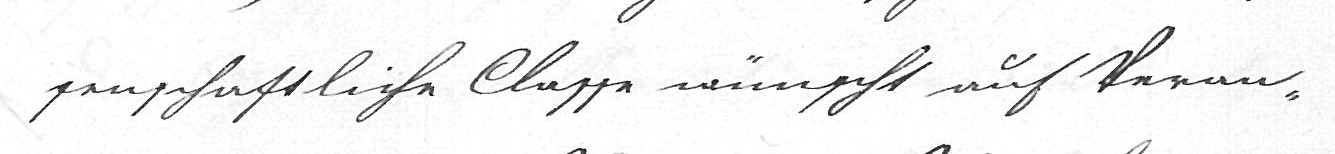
senschaftliche Classe wünscht auf Veran-
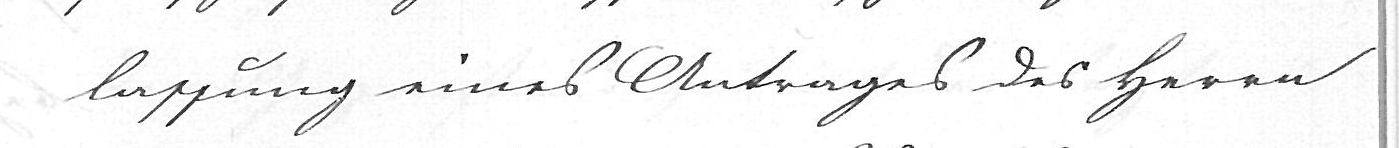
lassung eines Antrages des Herrn
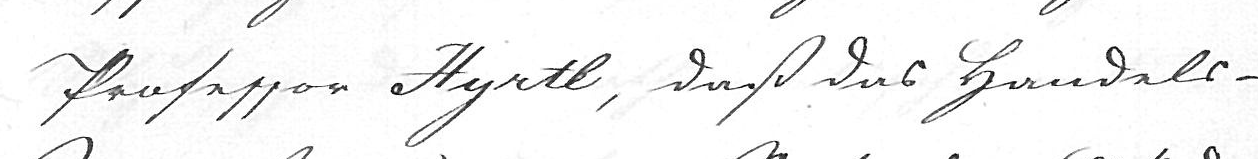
Professor Hyrtl, daß das Handels-
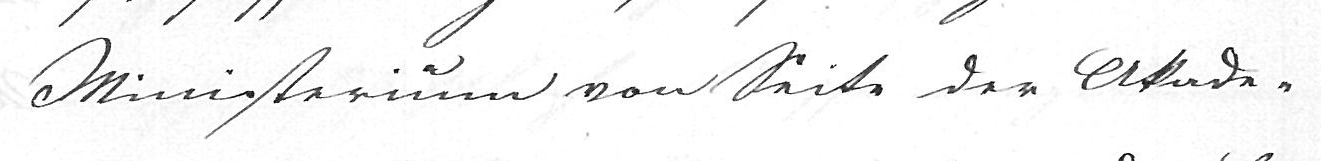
Ministerium von Seite der Akade-
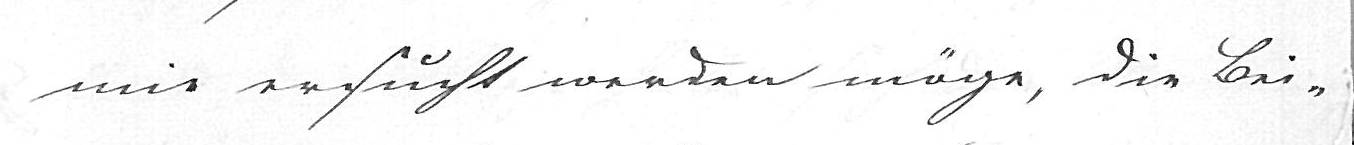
mie ersucht werden möge, die Bei-
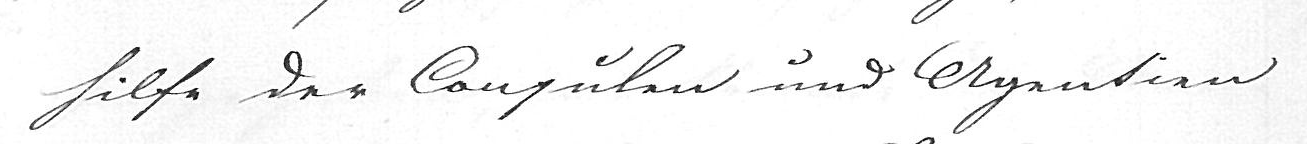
hilfe der Consulen und Agentien
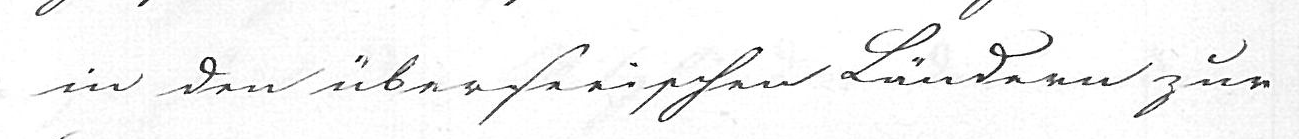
in den überseeischen Ländern zur
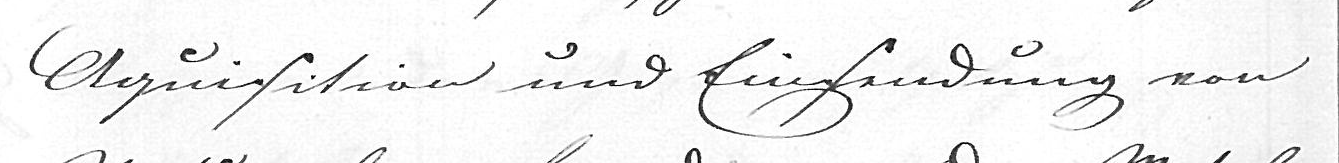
Aquisition und Einsendung von
